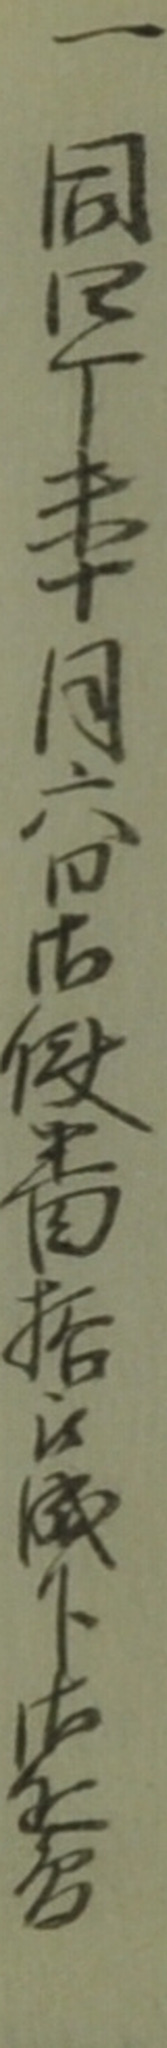一同四丁未十月六日御使番格被成下御近習
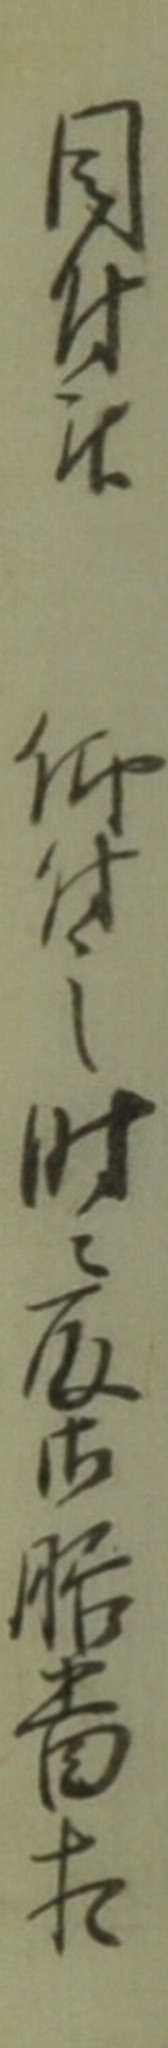目付被仰付之時ニ取御膳番相

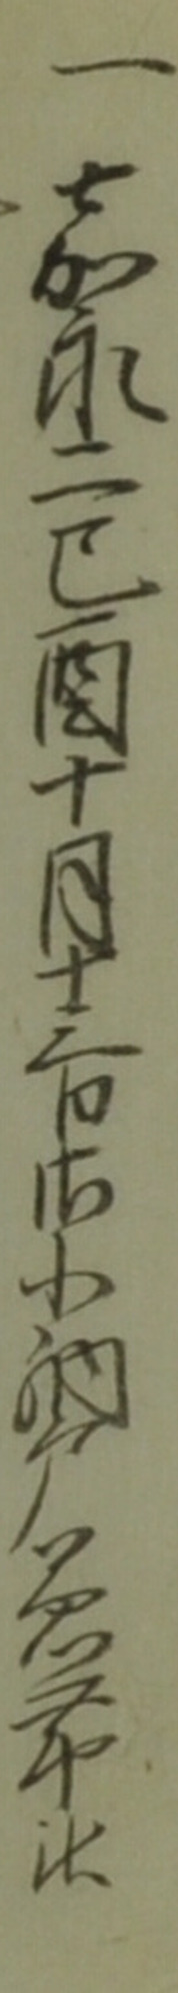一嘉永二己酉十月十三日御小納戸兼帯被
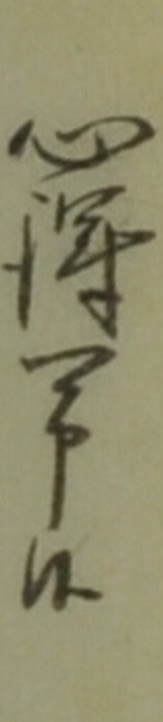心得可申候
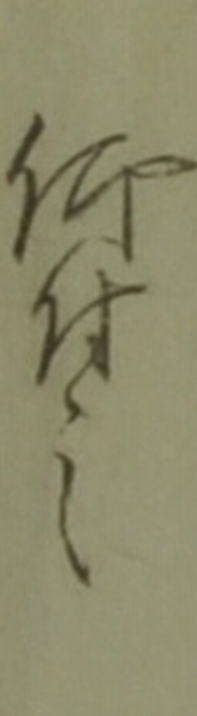仰付之
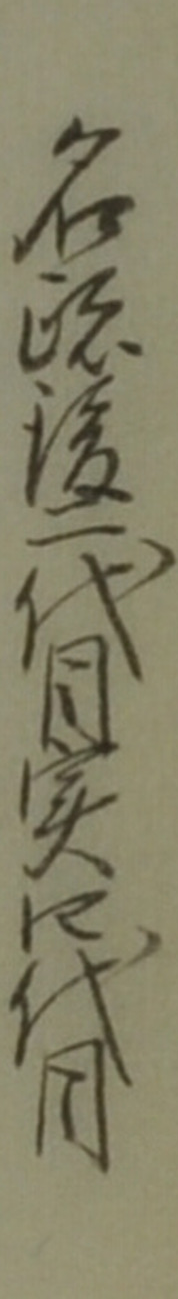名跡後二代目実四代目
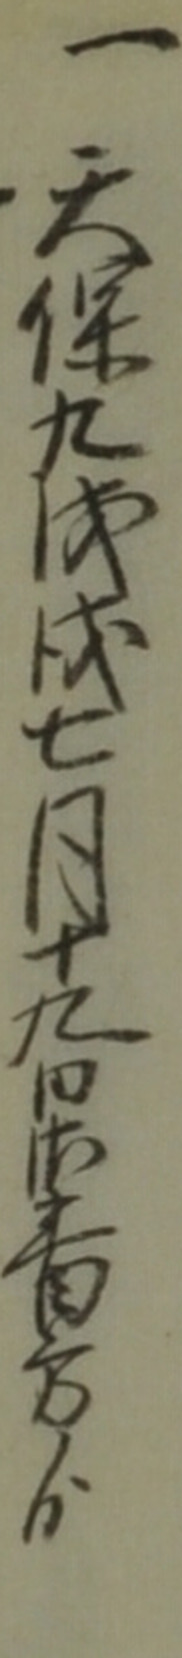一天保九戊戌七月十九日御番方ゟ
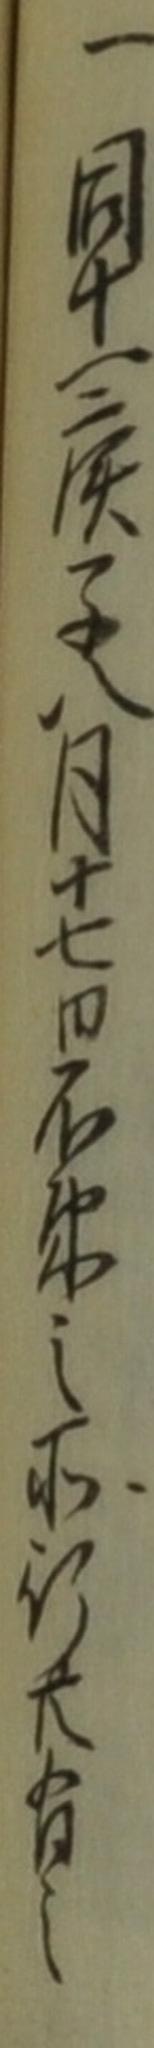一同十一庚子八月十七日不束之所行共有之
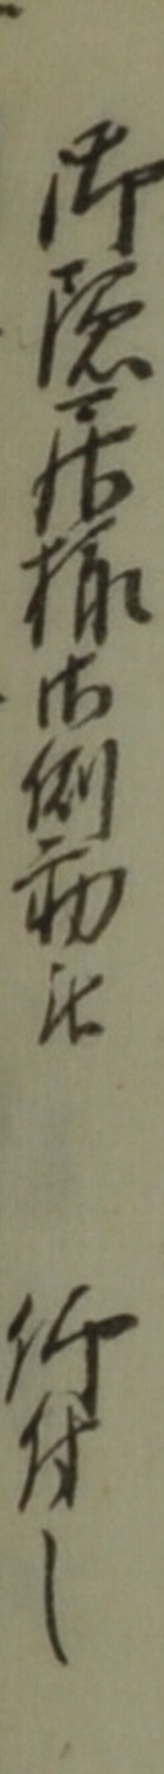御隠居様御側勤被仰付之
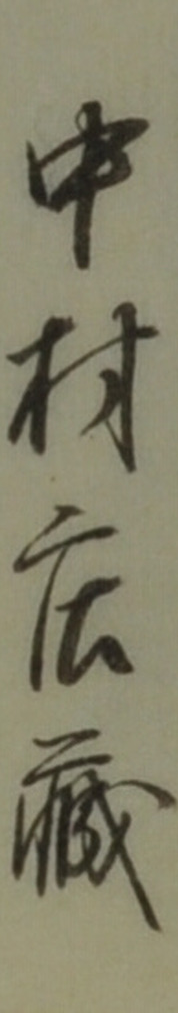中村庄蔵
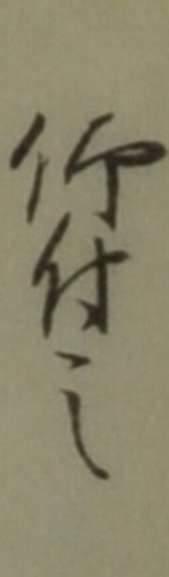仰付之
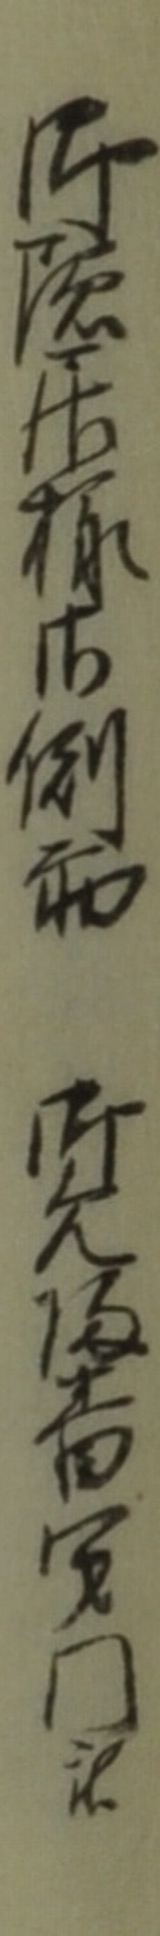御隠居様御側勤御免帰番閉門被
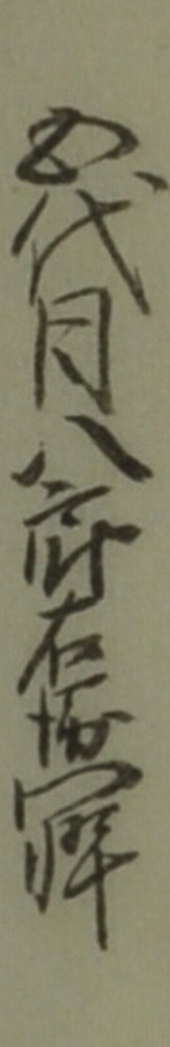五代目八郎右衛門忰
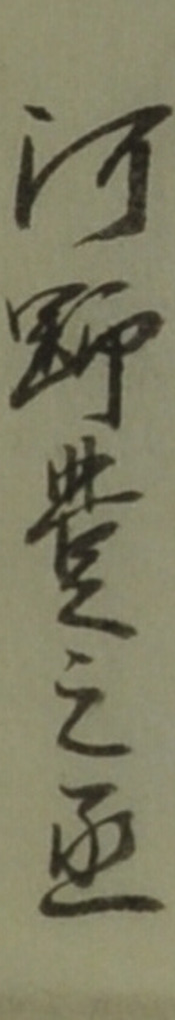河野豊之丞
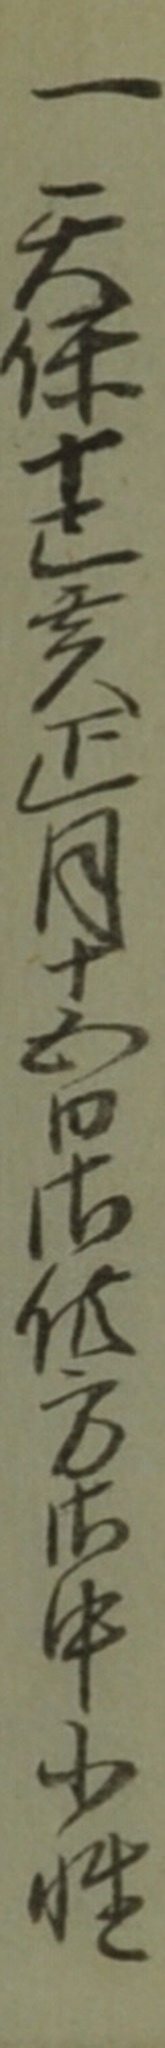一天保十己亥正月十五日御供方御中小性
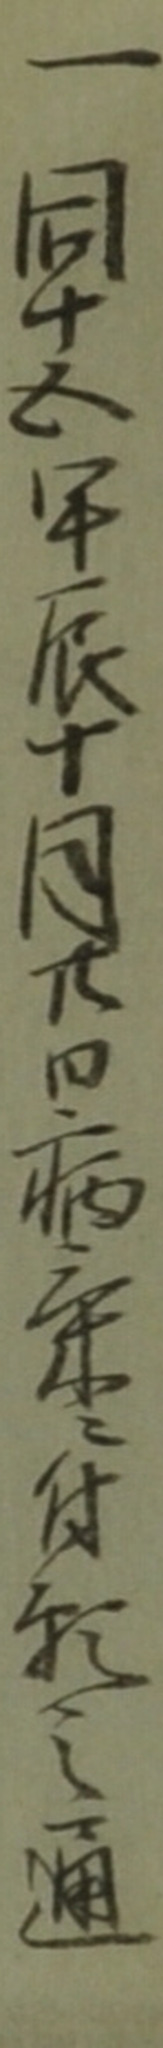一同十五庚辰十月廿日病気ニ付願之通
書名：諸御役代々録（五）
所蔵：伊那市立高遠町図書館・合同会社AMANE
